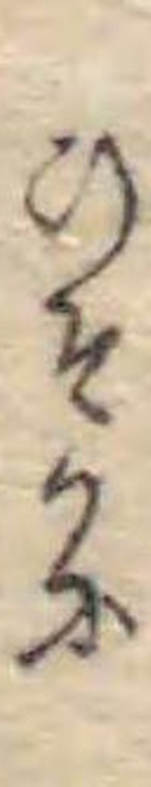ひそかに
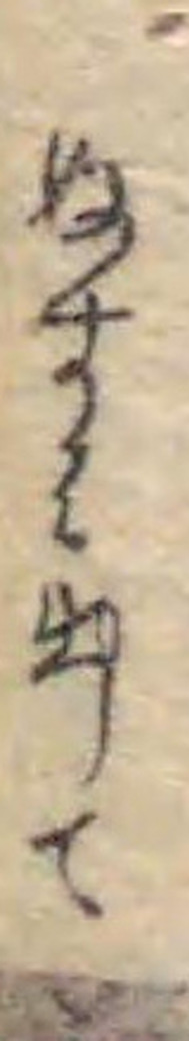ぬすみ出して
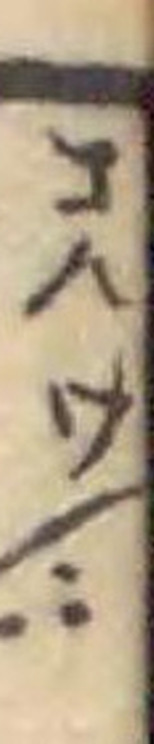さんけ
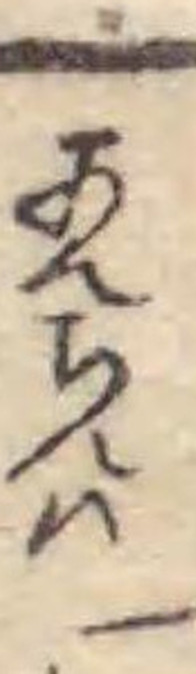あんちんは
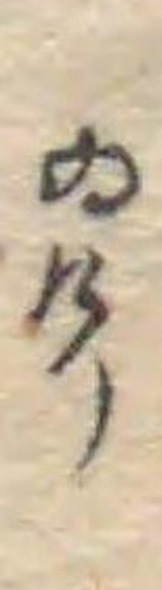ゐけり
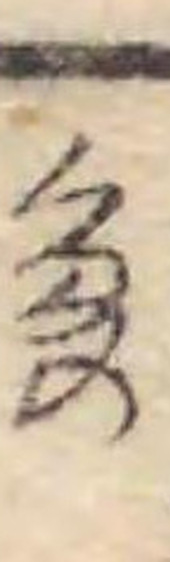くまの
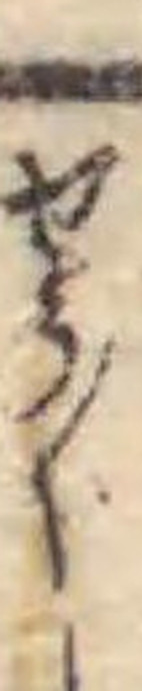せう〴〵
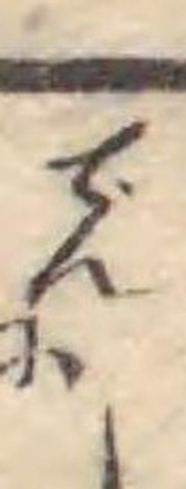でんに
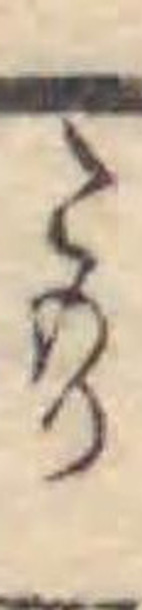こもり
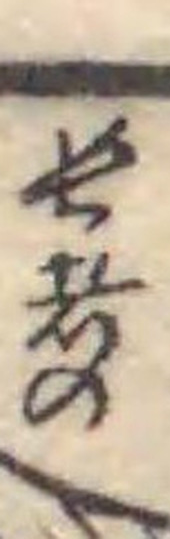長者の
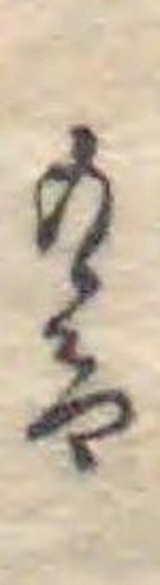もはや
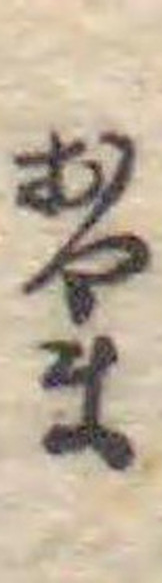おやま
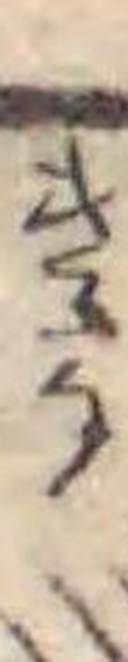きたり
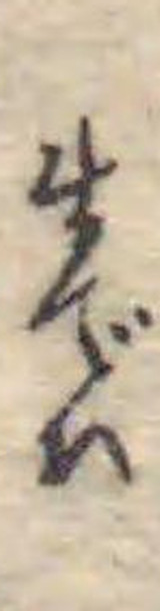までは
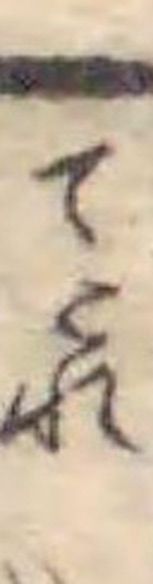てこれ
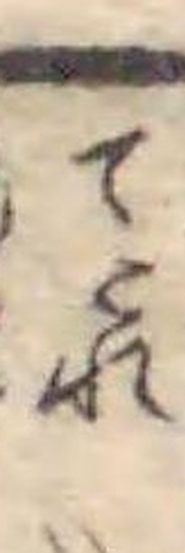てこれ
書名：鐘入七人化粧 : 3巻
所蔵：国立国会図書館 National Diet Library, JAPAN
